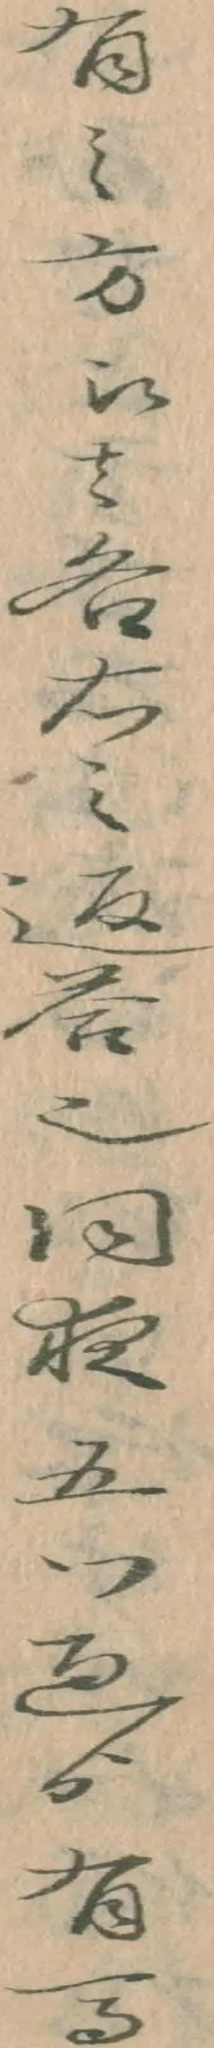有之方江者各右之返答也同夜五つ過ゟ有馬
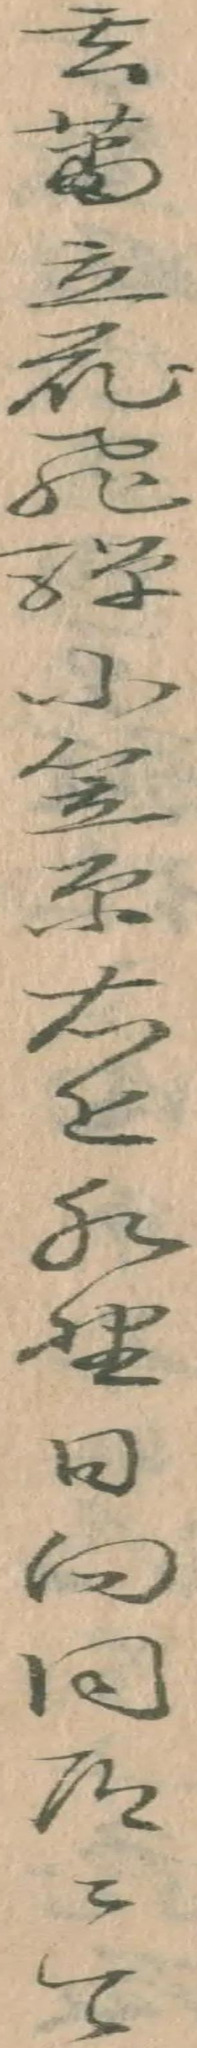玄蕃立花飛騨小笠原右近水野日向同道にて
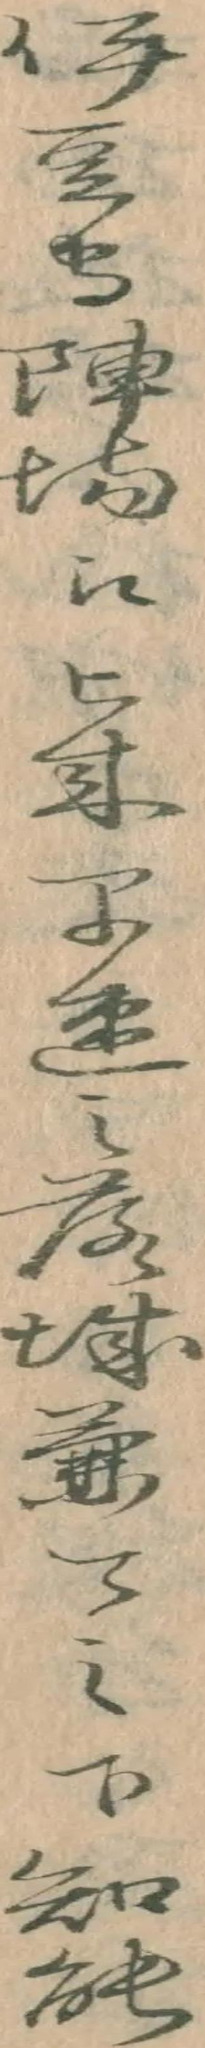伊豆守陣場江被来早速之落城兼て之下知能
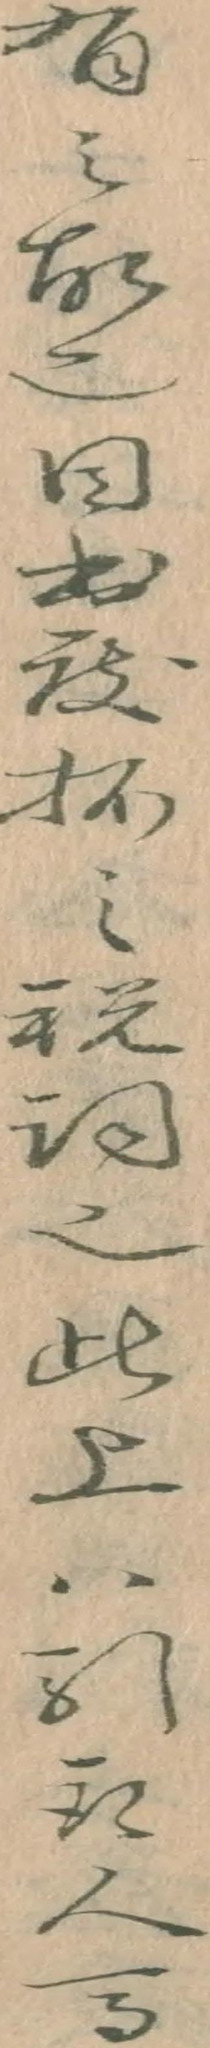有之故也目出度杯之祝詞也此上は引取人馬
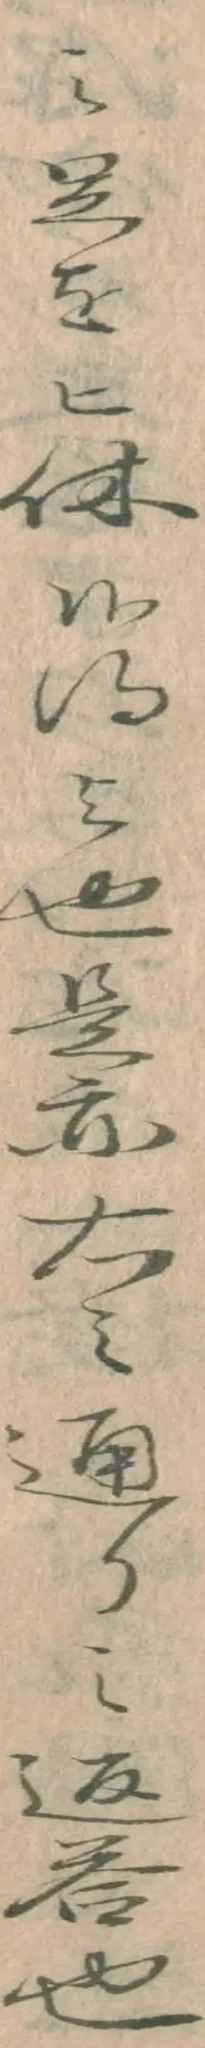之足を被休候得与也是亦右之通り之返答也
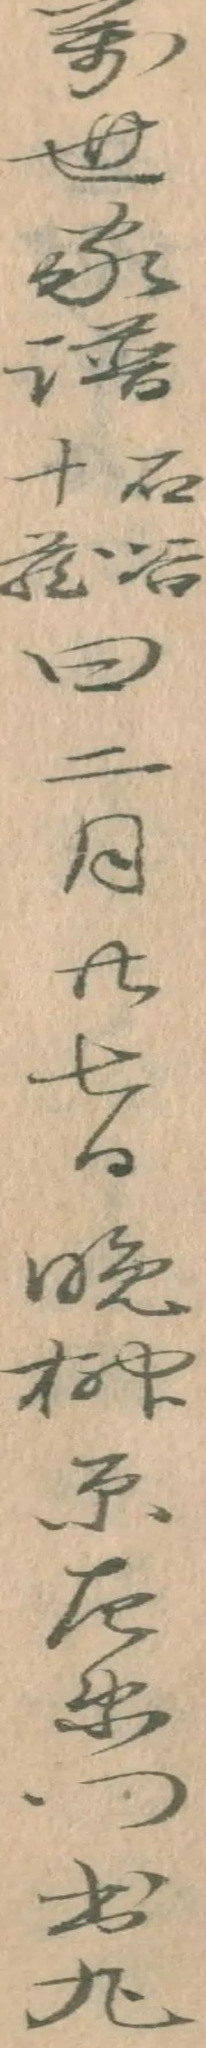万世家譜石谷十蔵曰二月廿七日晩榊原左衛門出丸
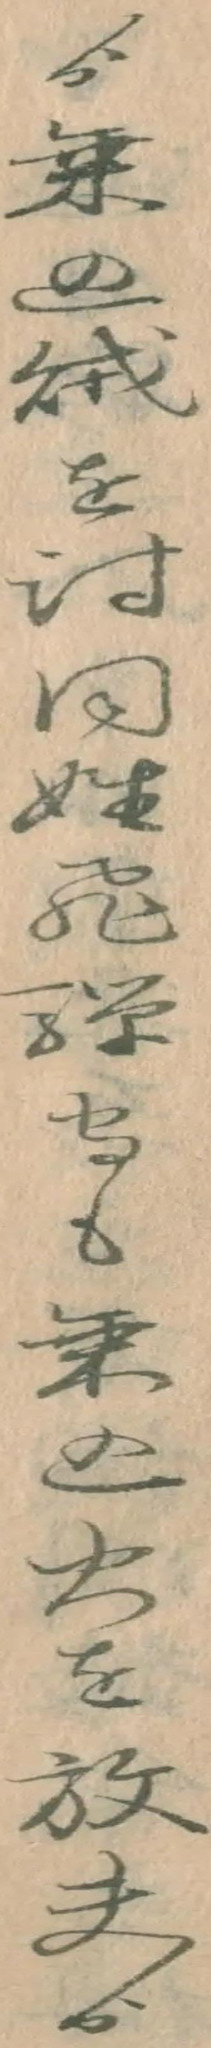ゟ乗込賊を討同姓飛騨守も乗込火を放夫ゟ
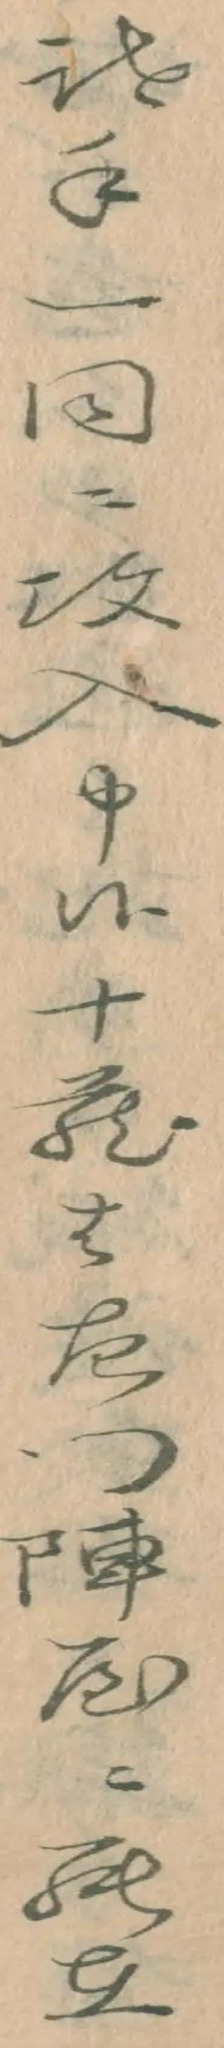諸手一同に攻入申候十蔵者左門陣屋に罷在

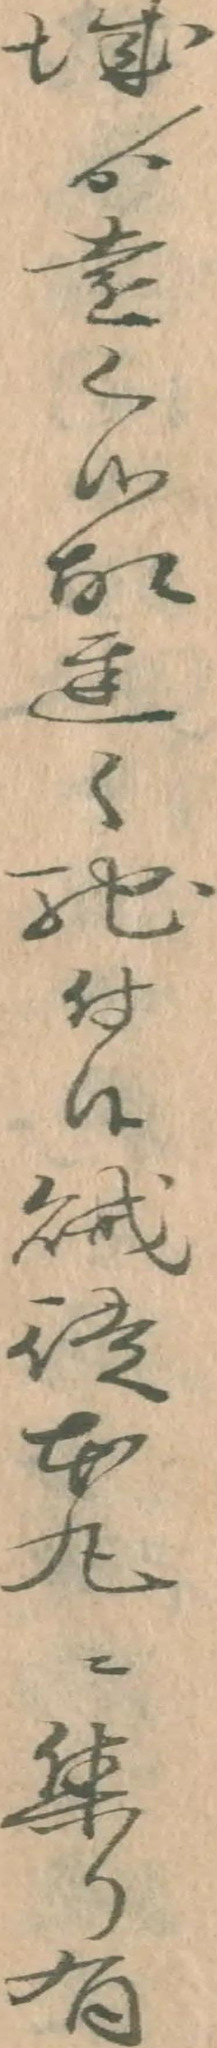城ゟ遠く候故遅く馳付候賊徒本丸に集り有
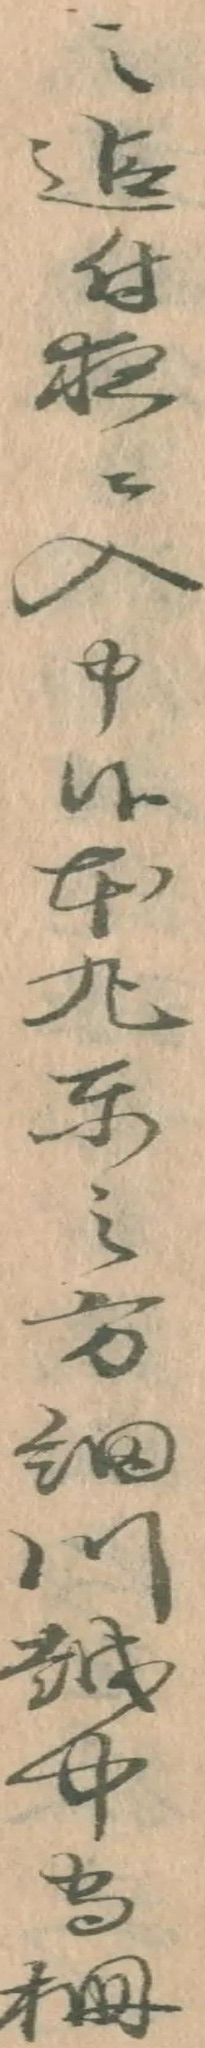之追付夜に入申候本丸東之方細川越中守柵
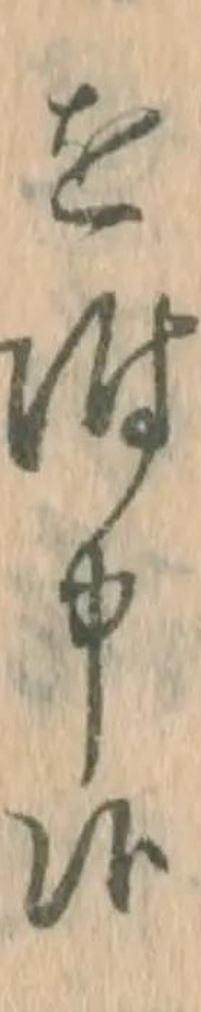を附申候
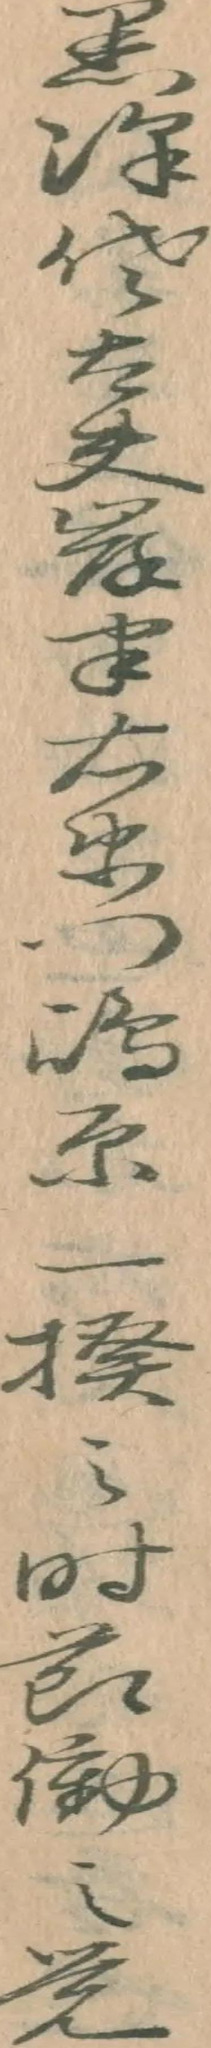黒沢佐太夫岸半右衛門島原一揆之時節働之覚
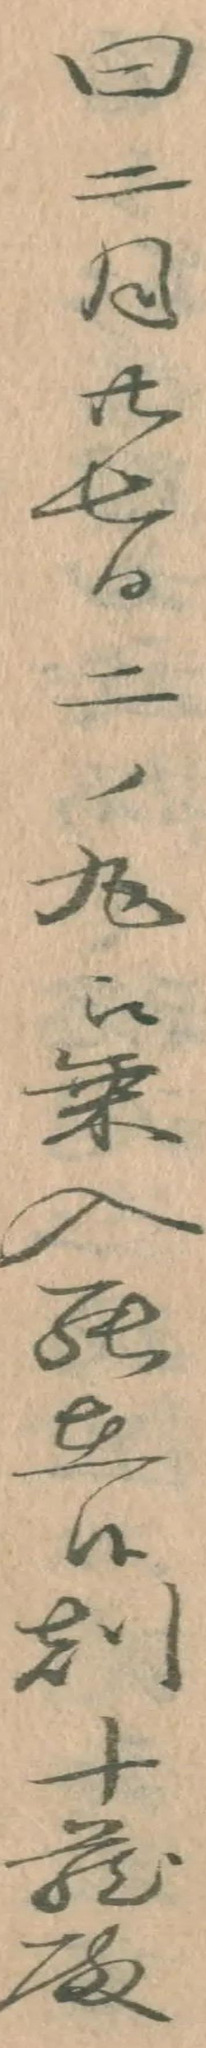曰二月廿七日二之丸江乗入罷在候刻十蔵殿
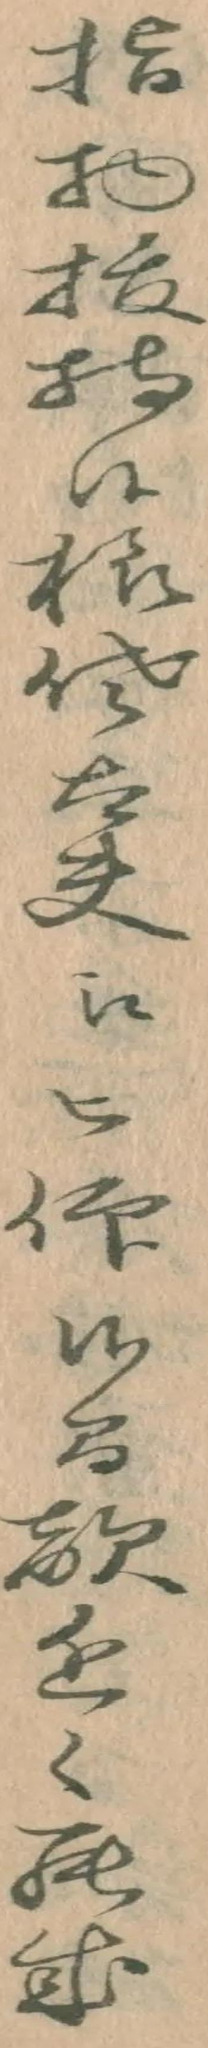指物抜持候様佐太夫江被仰候間敵近く罷成
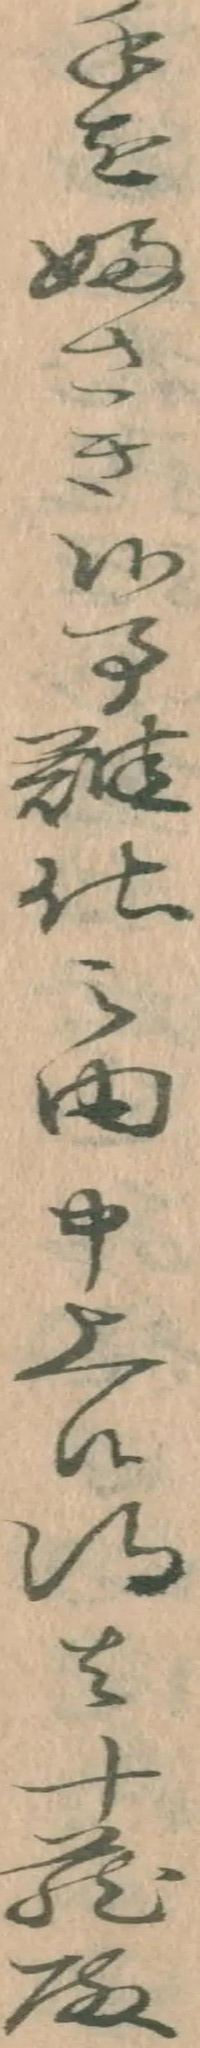手を婦さき候事難仕之由申上候得者十蔵殿
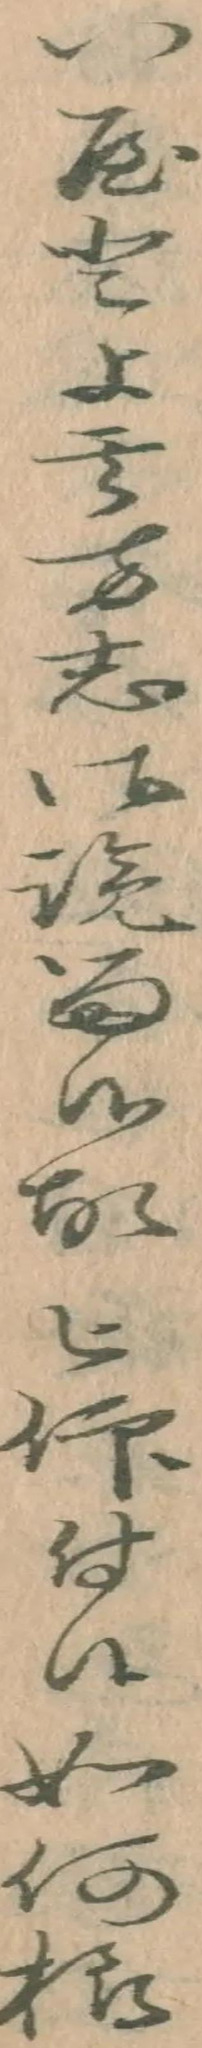い屋登よ其方志御覧留候故被仰付候如何様
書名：切支丹御退治記 49巻. [8]
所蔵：国立国会図書館 National Diet Library, JAPAN
